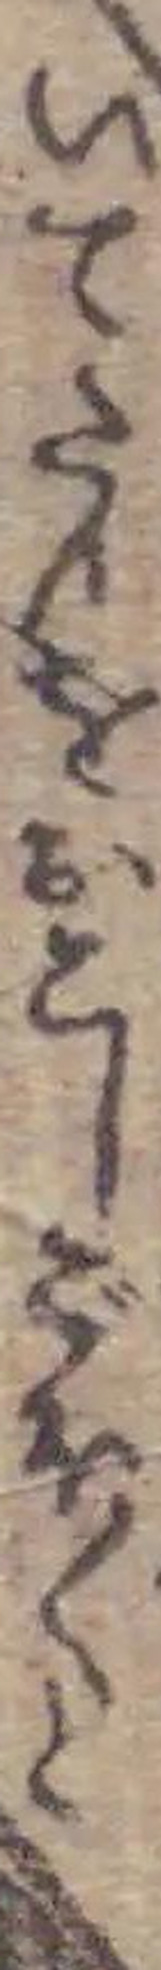くらいてたんをおこしごほ〳〵と
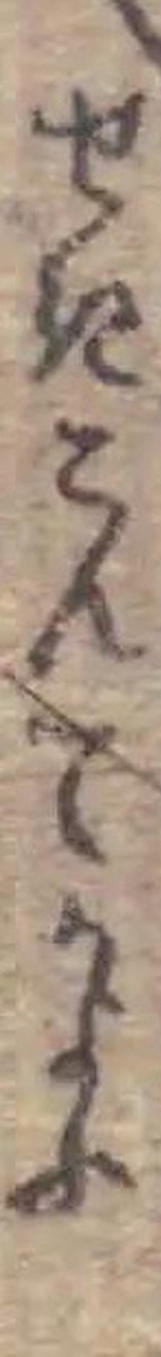せきこんてかよふ
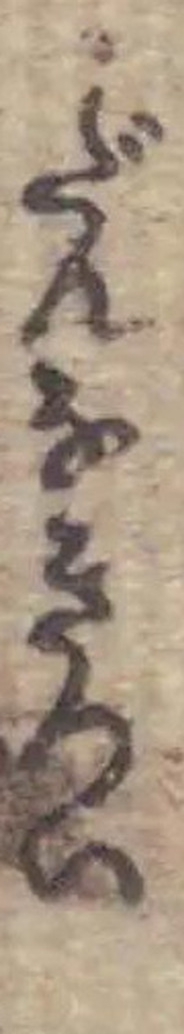だんなきつい
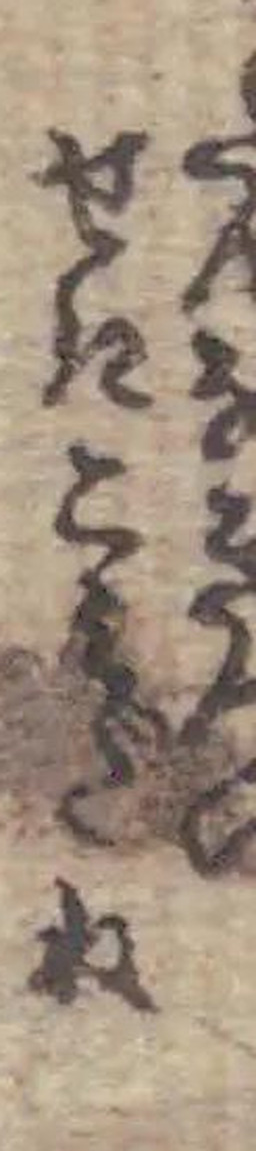せきこみだね
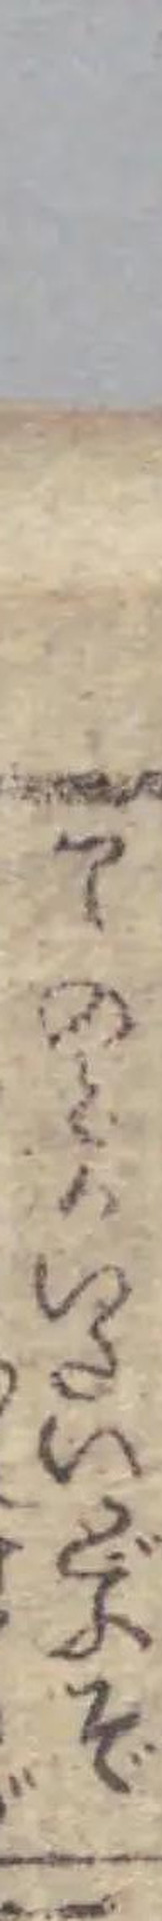アヽのとかいたいどふぞ
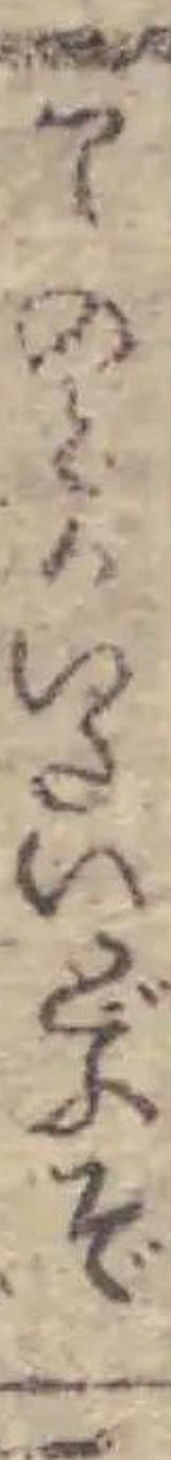アヽのとかいたいどふぞ
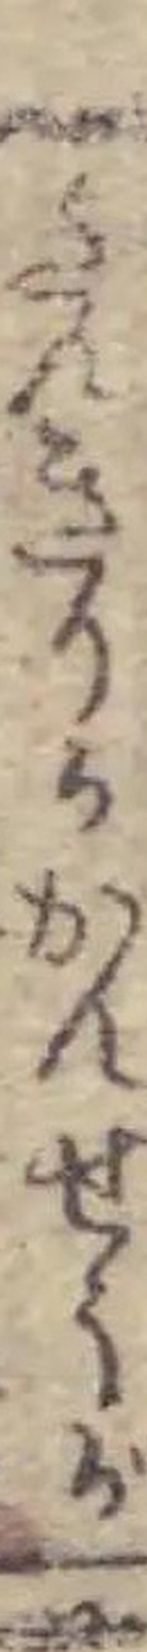たんきりかかんせうが
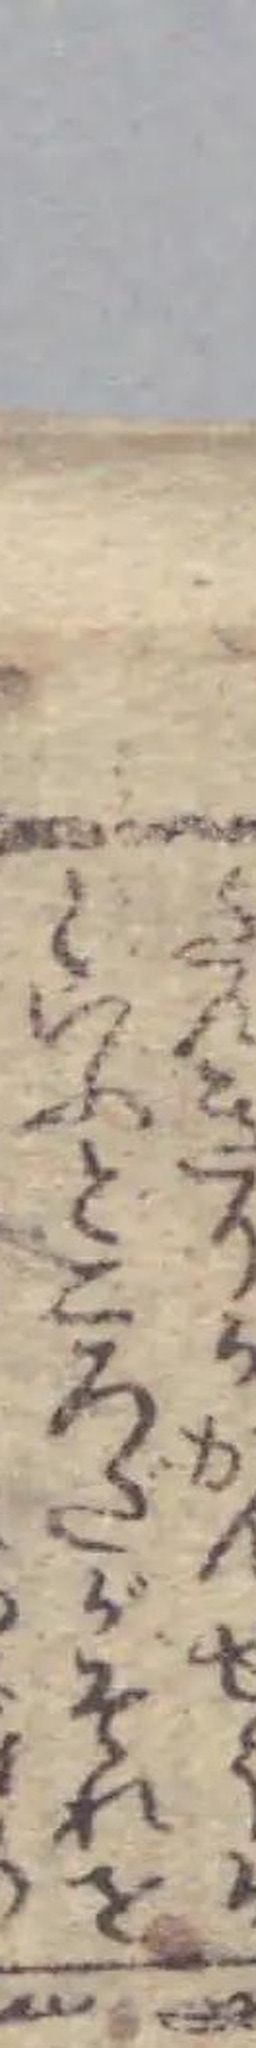いふところだがそれを
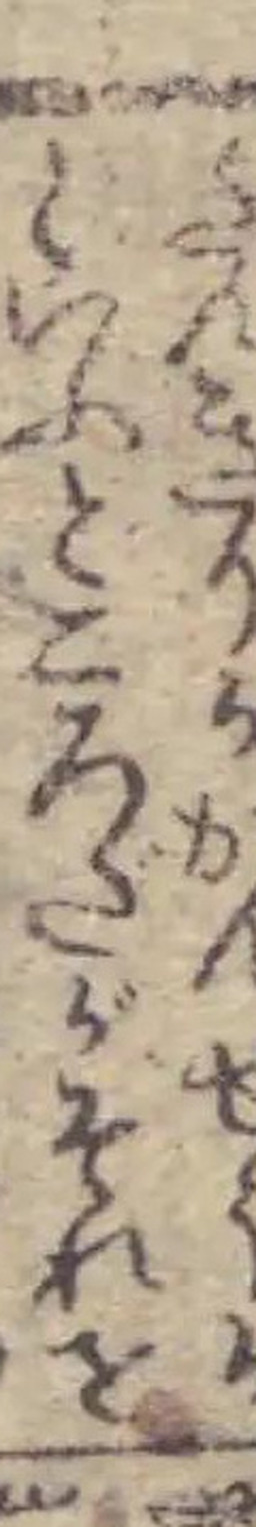いふところだがそれを
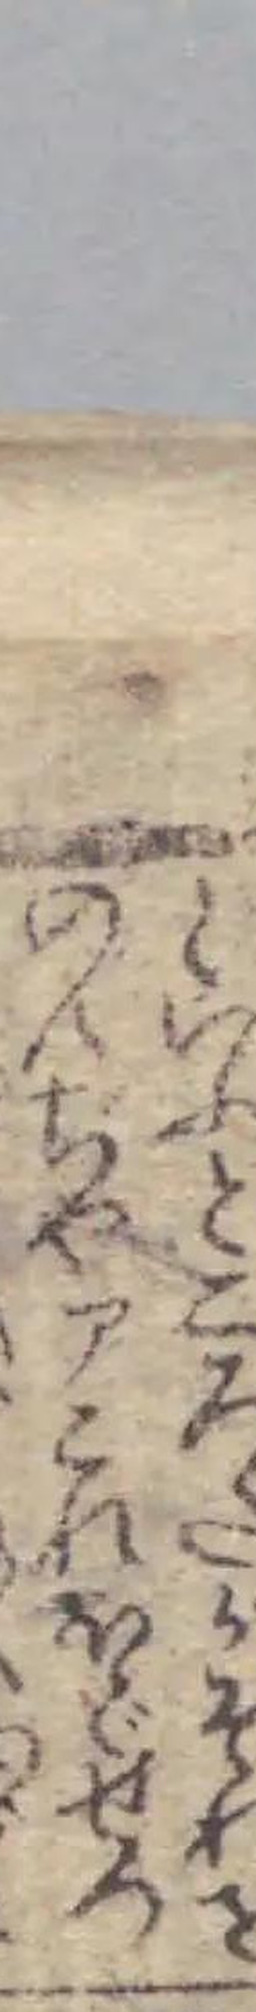のんじやアこれほどせつ
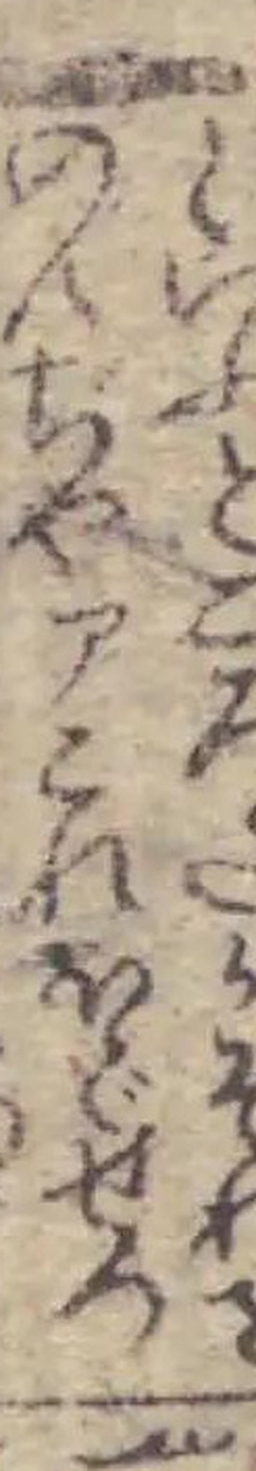のんじやアこれほどせつ
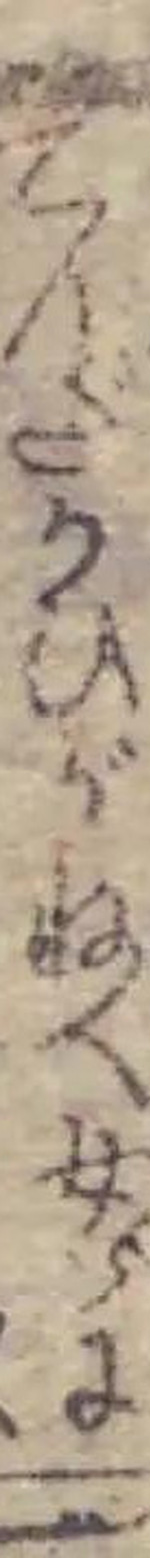こんだかひがねへ女郎に
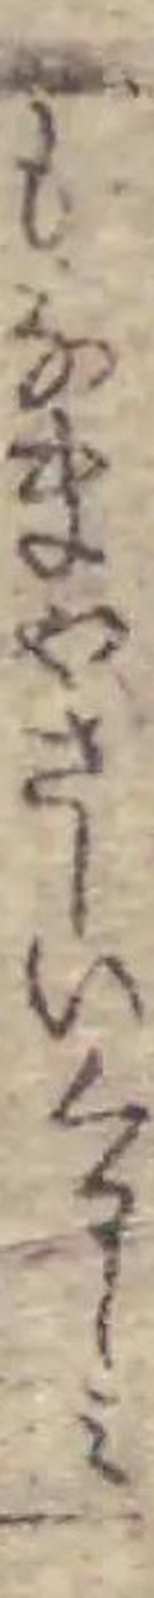もなまやさしいくるしみ
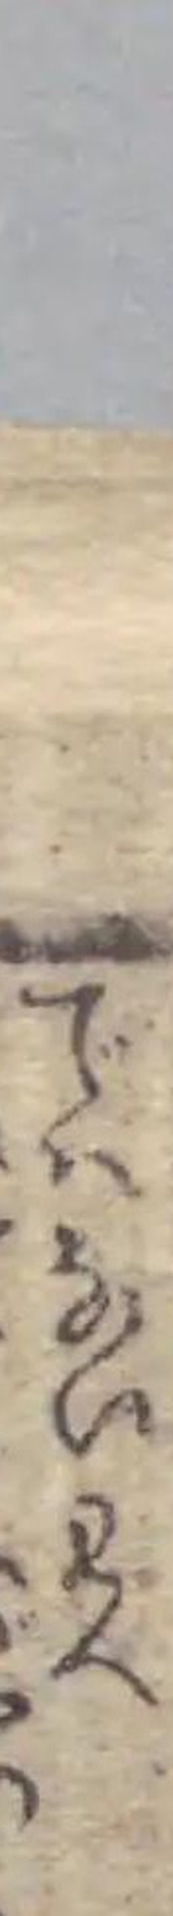ではないわへ
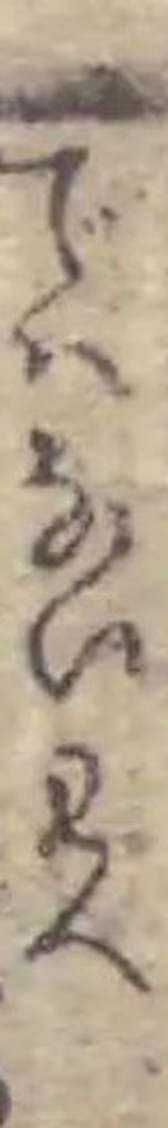ではないわへ
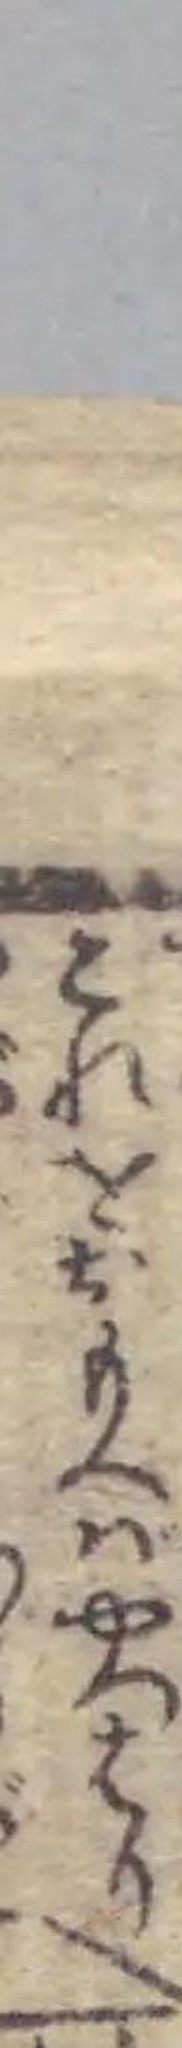これをおもへばやつはり
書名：色男其処此処 3巻
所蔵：国立国会図書館 National Diet Library, JAPAN
